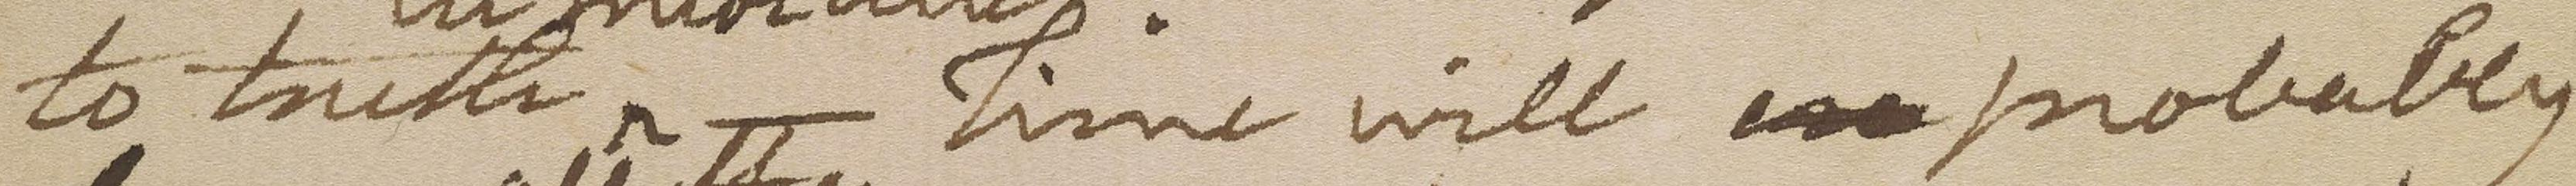to truth ^ all the Time will [m] probably
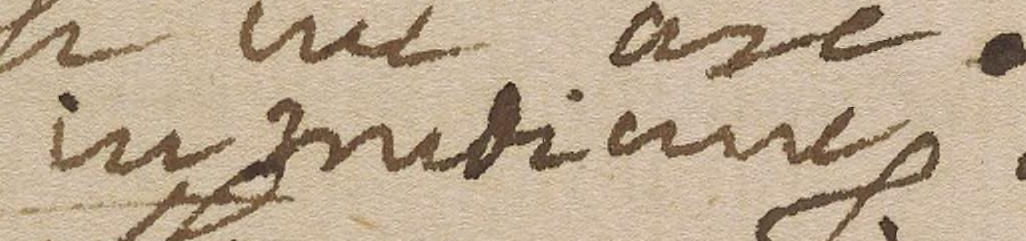in medicine
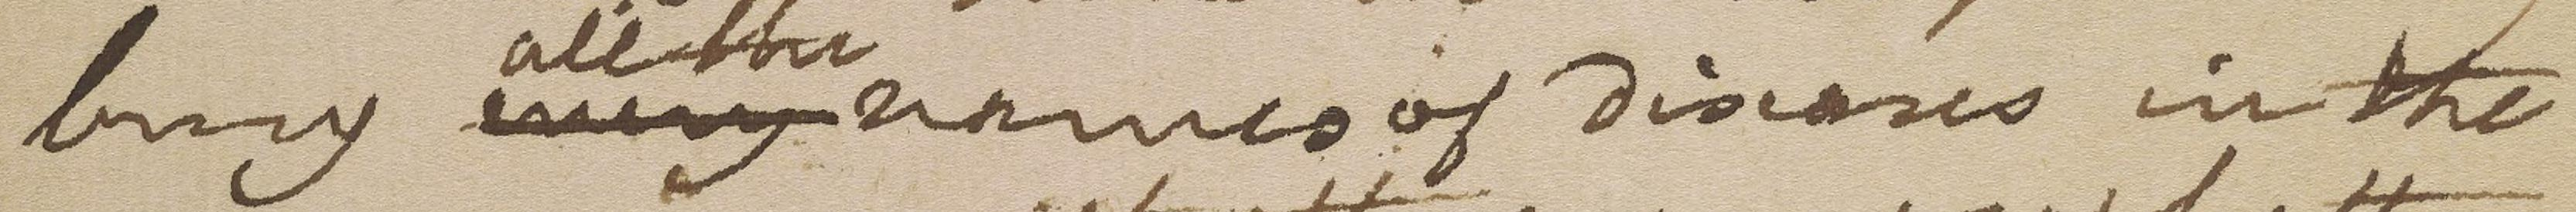bury [many] names of diseases in the
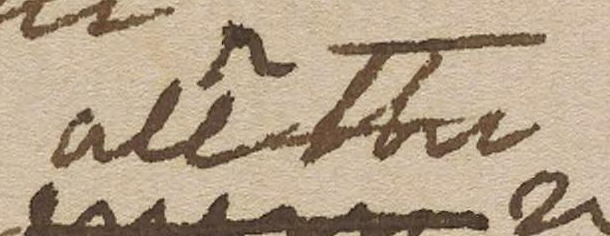all the
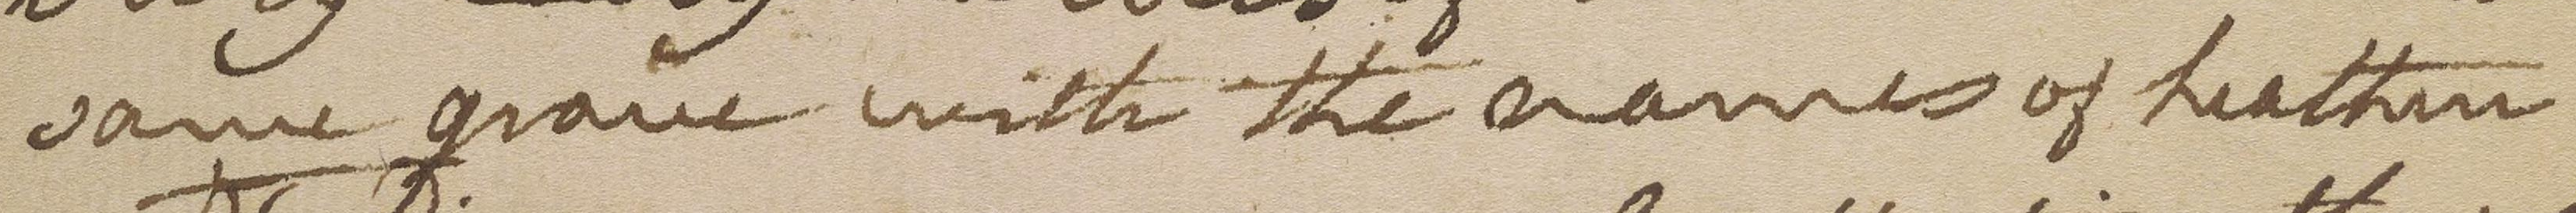same grave with the names of heathens.
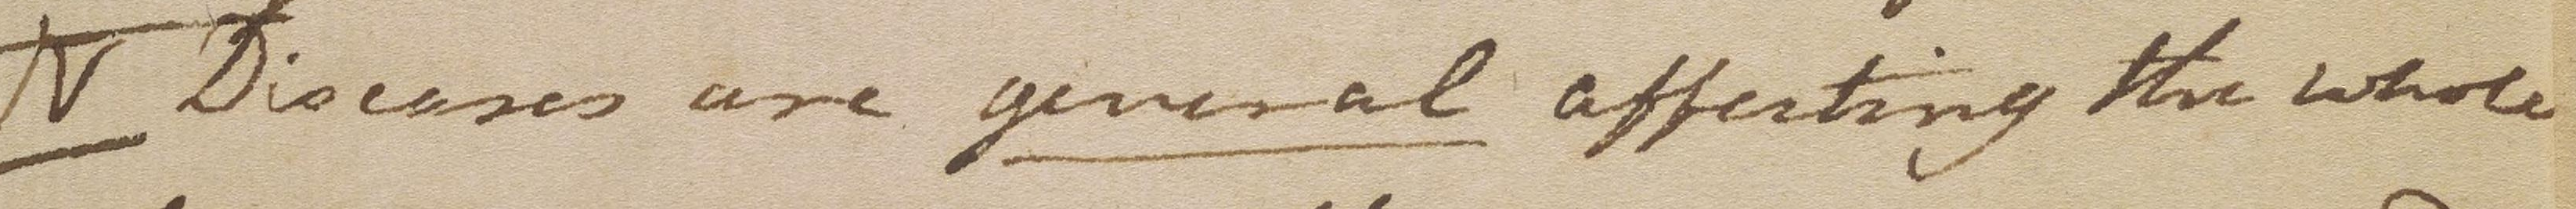(V Diseases are general affecting the whole
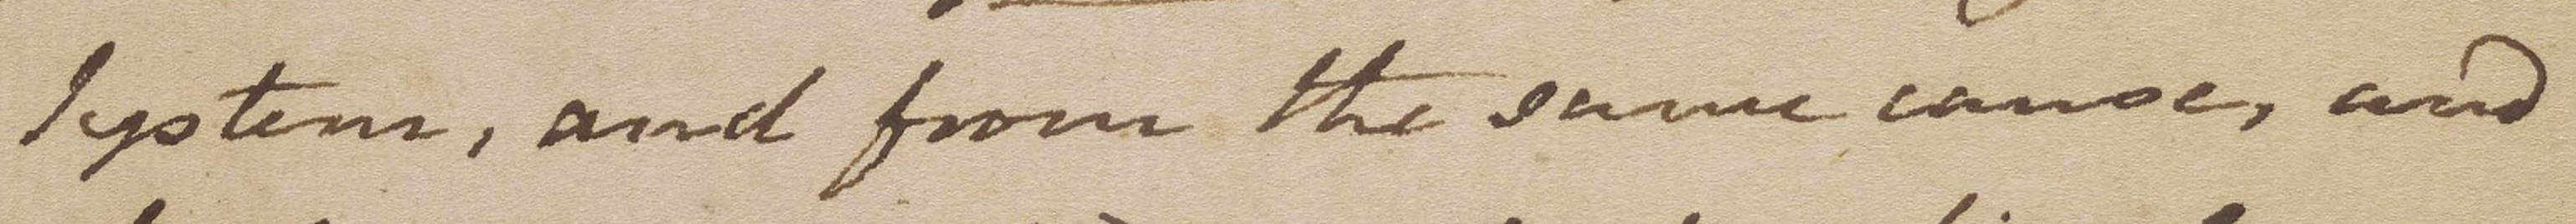system, and from the same cause, and
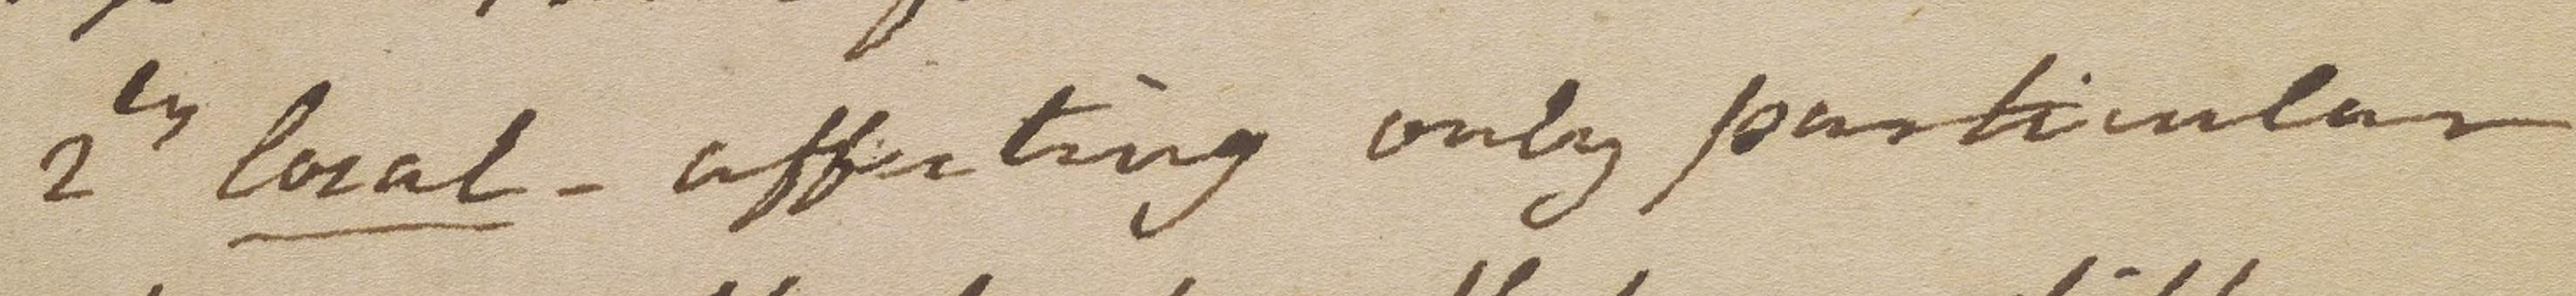2^ly local, affecting only particular
